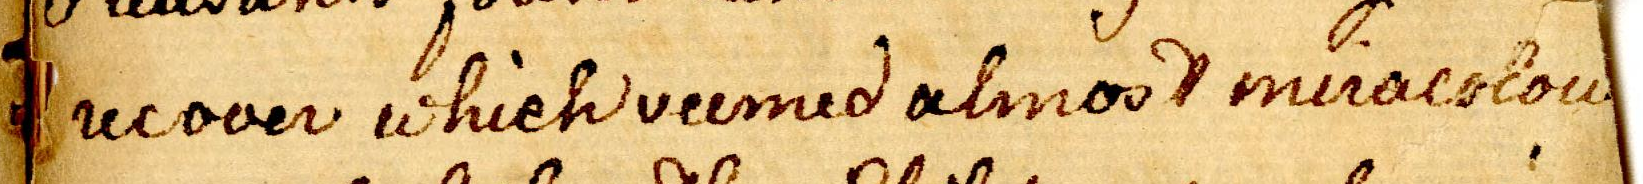recover which seemed almost miracolou
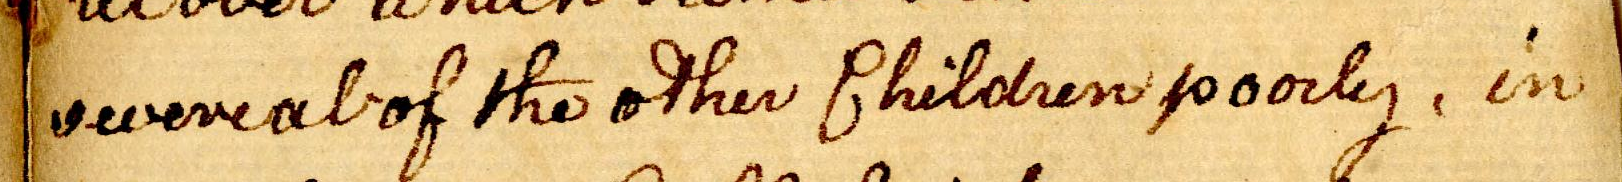severeal of the other Children poorly, in
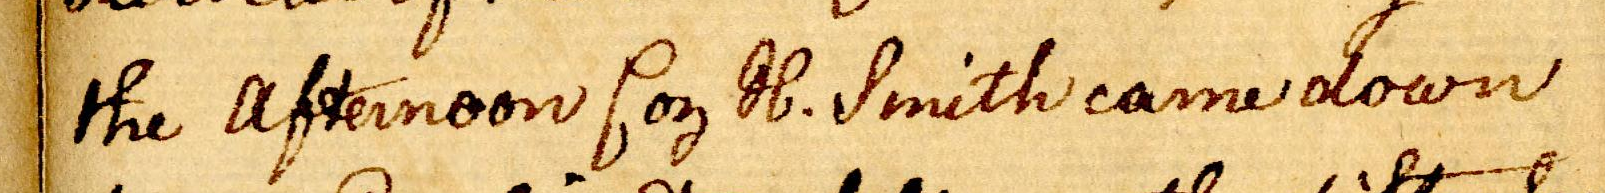the Afternoon Coz H. Smith came down
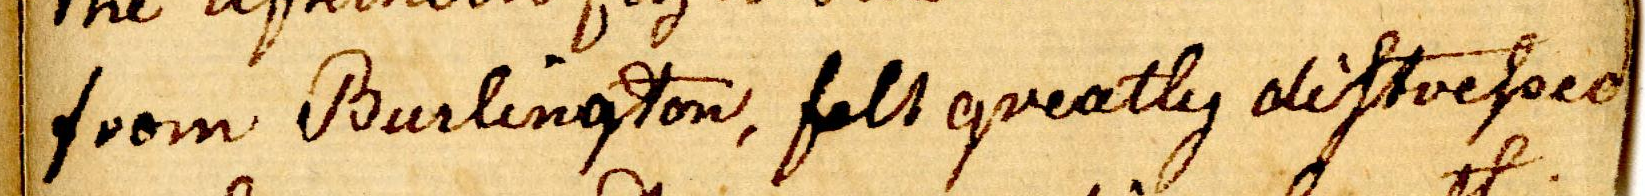from Burlington, felt greatly distresses
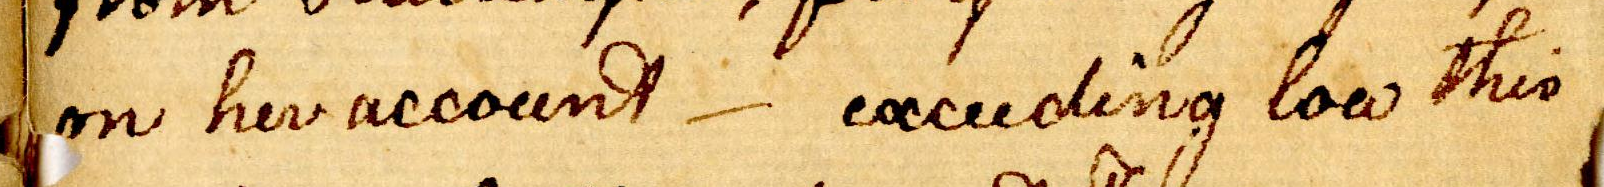on her account- exceeding low this
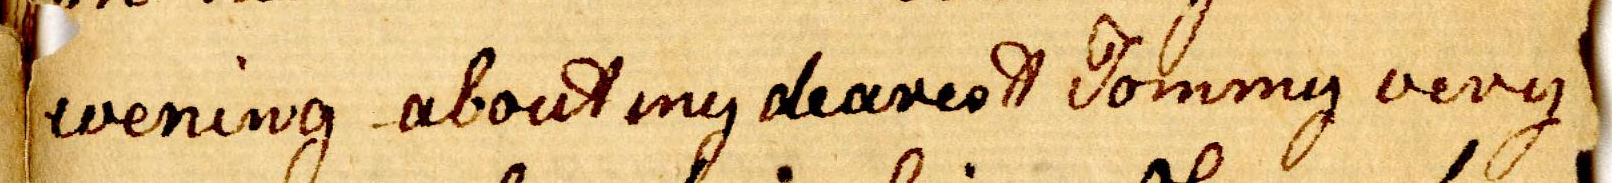evening about my dearest Tommy very
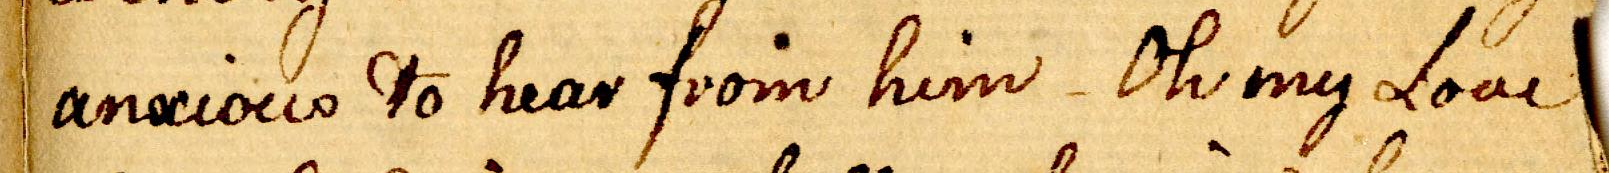anxious to hear from him- Oh my Love
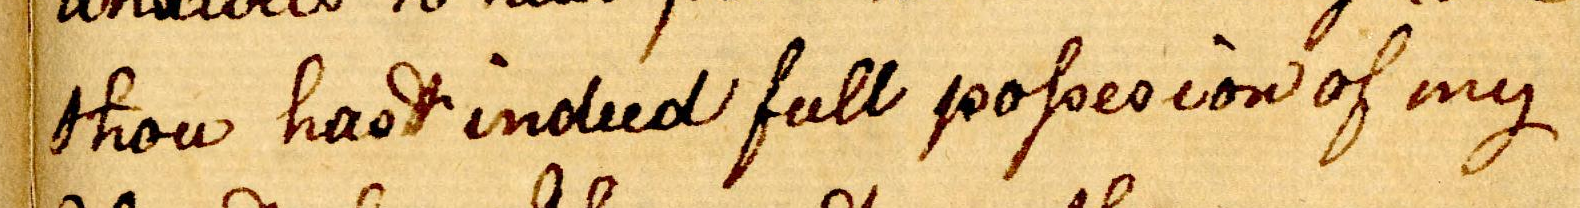thou hast indeed full possesion of my
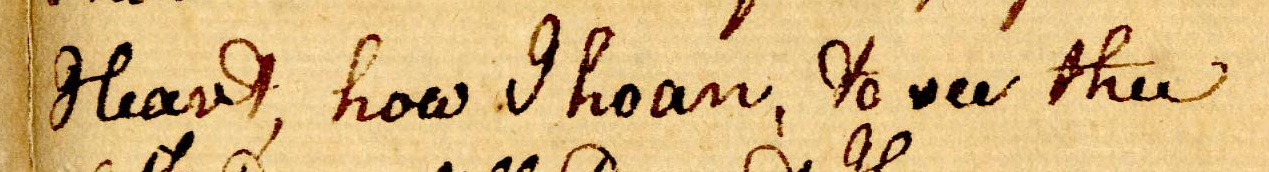Heart, how I hoan, to see thee
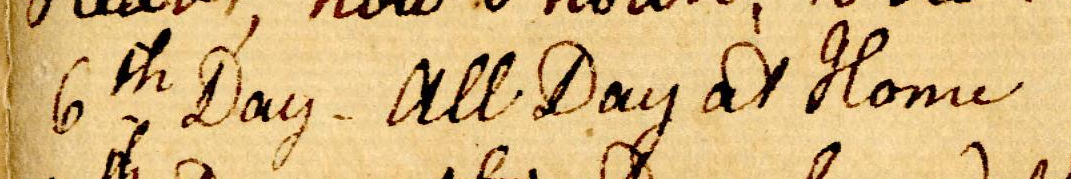6^th Day- All Day at Home
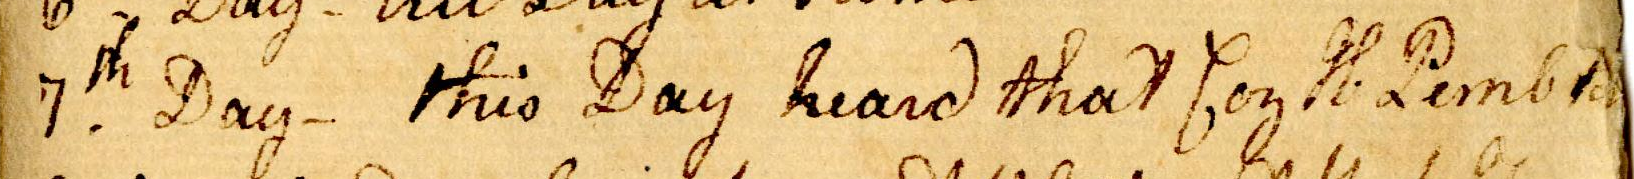7^th Day- this Day heard that Coz H Pembton
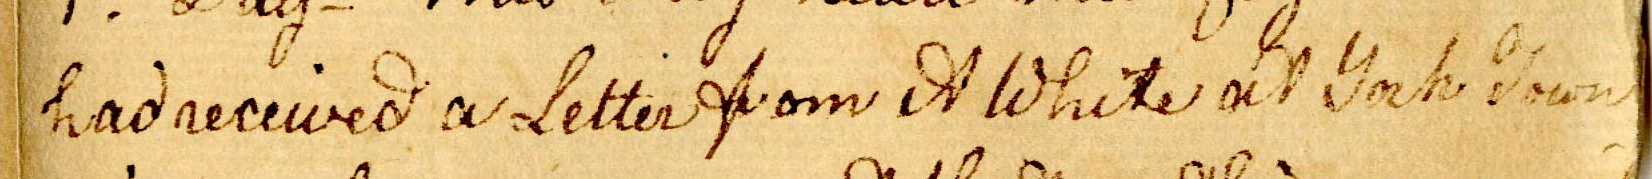had received a Letter from A White at York Town
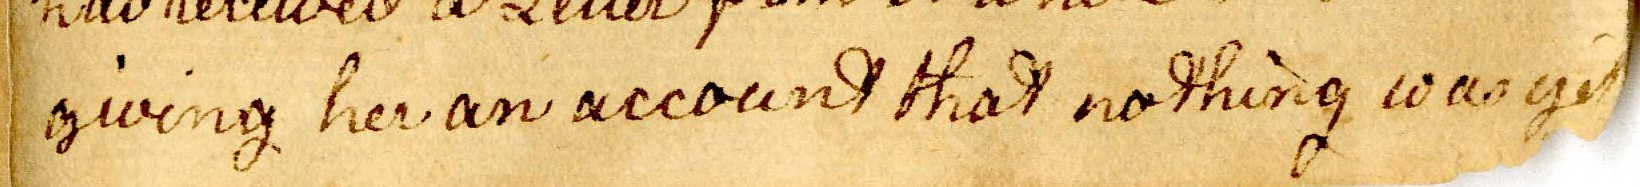giving her an account that nothing was yet
